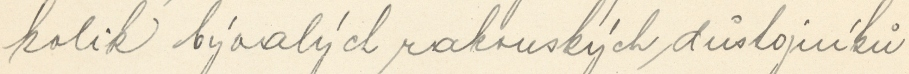kolik bývalých rakouských důstojníků
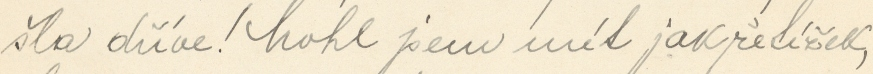šla dříve! Mohl jsem mít jak řetížek,
